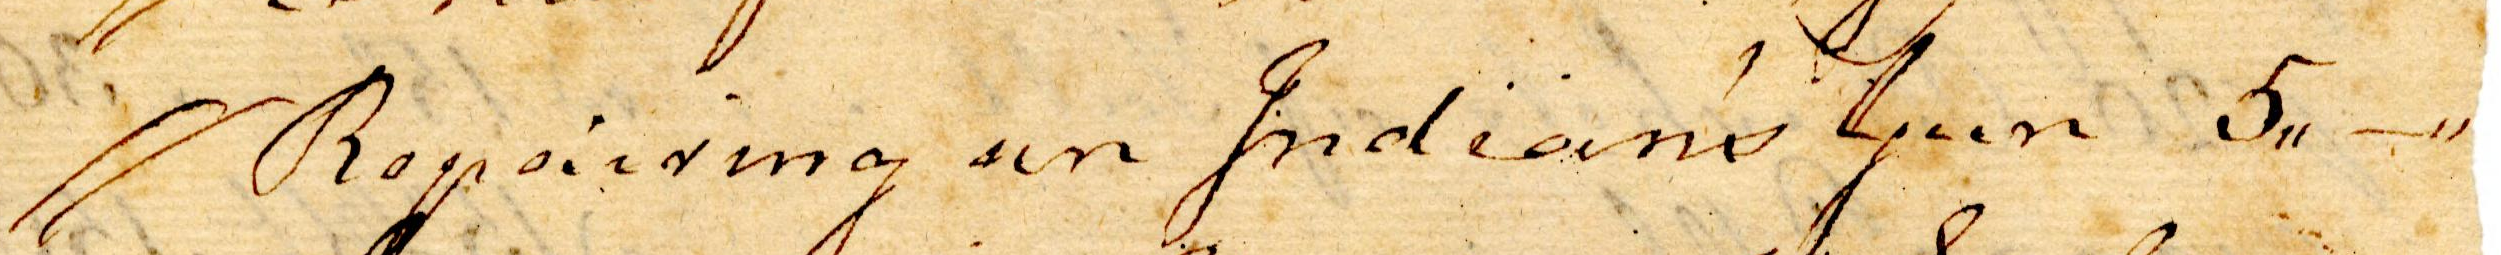Roquesting an Indians Gun 5..-
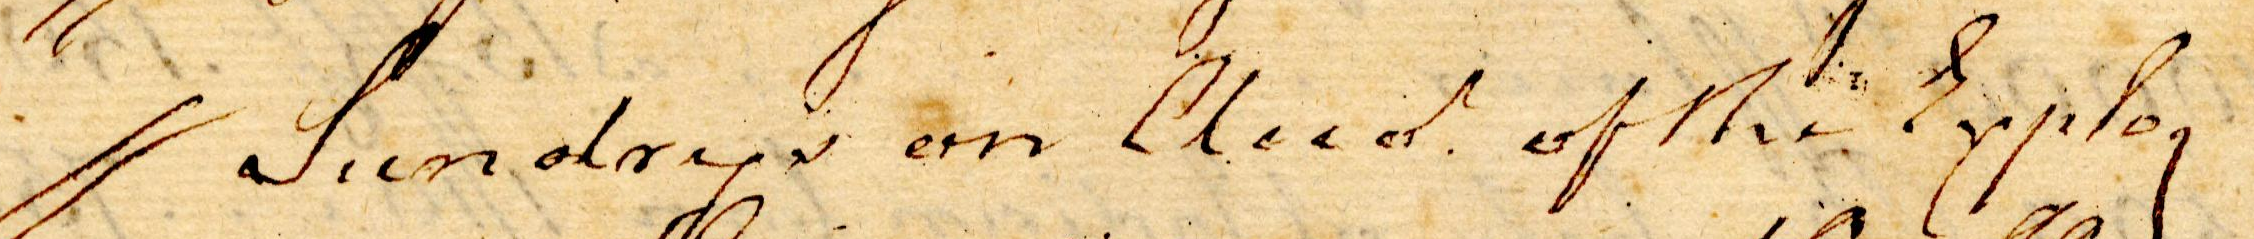Sundrys on Acco^t of the explor-
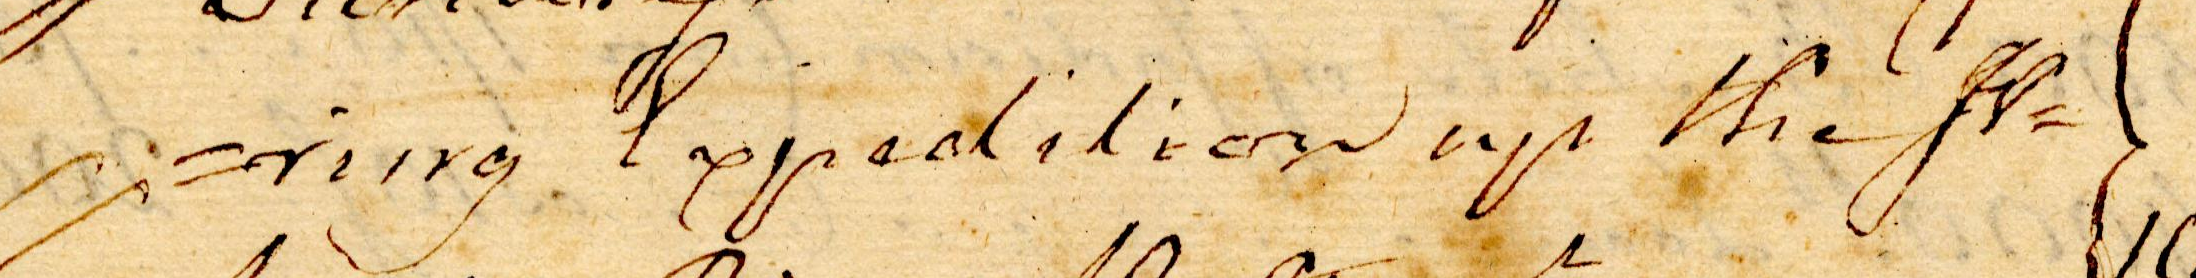-ing Expedition up the Il-
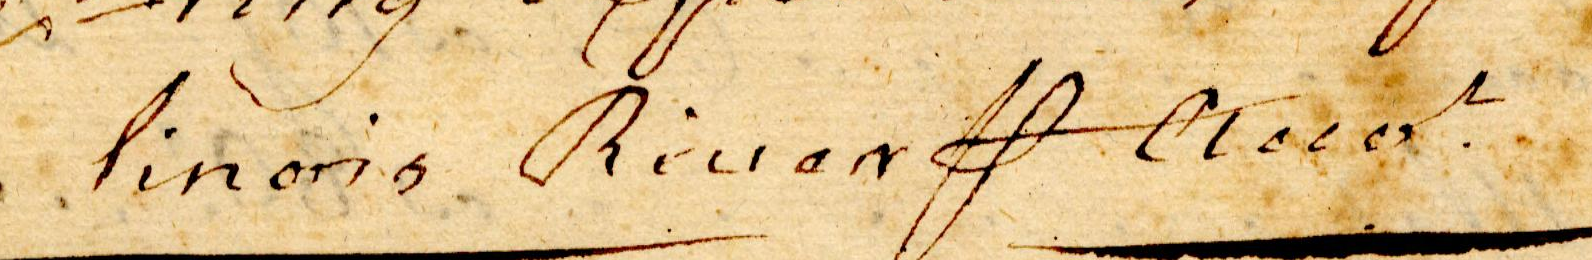linois River per Acco^t.
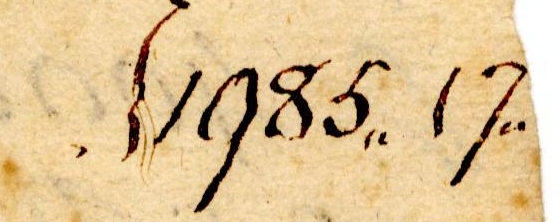£1985.17.
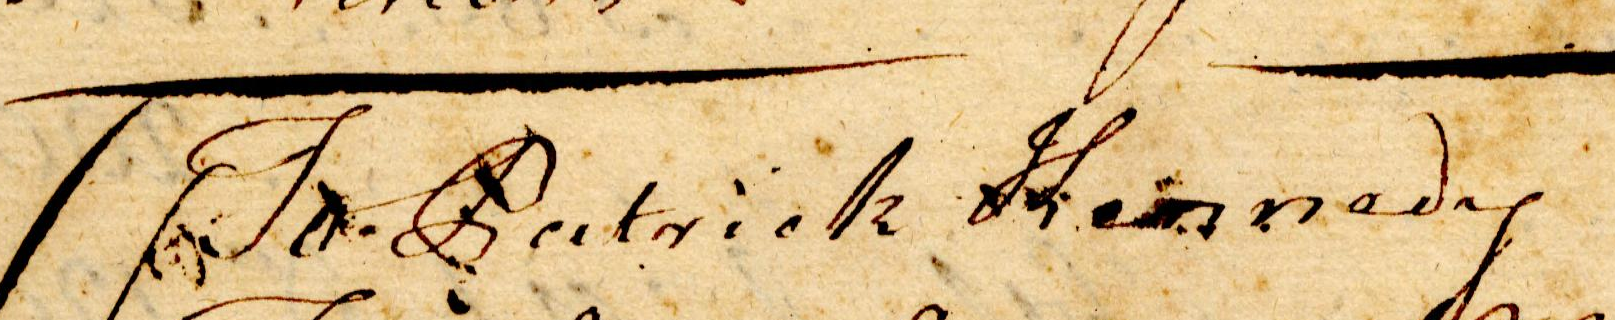To Patrick Hennedy
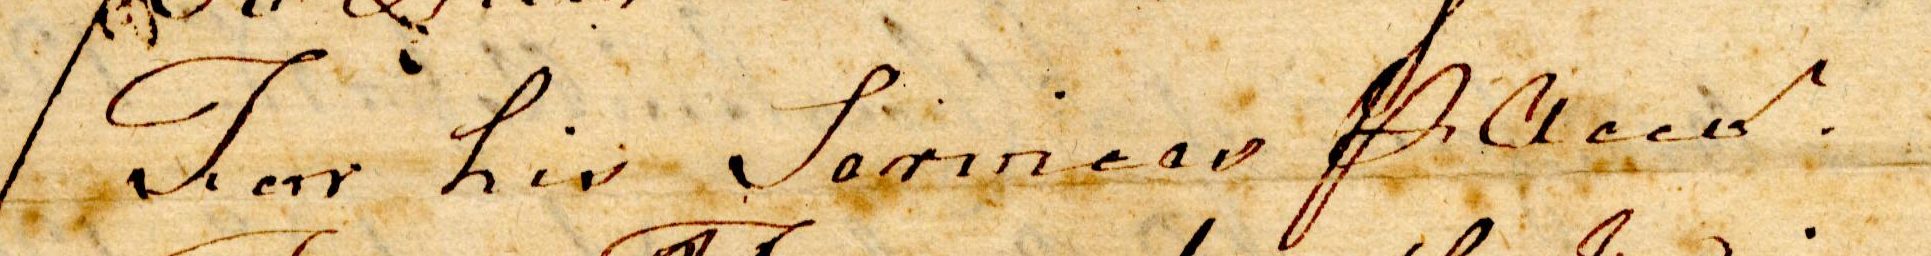For his service per acco^t
